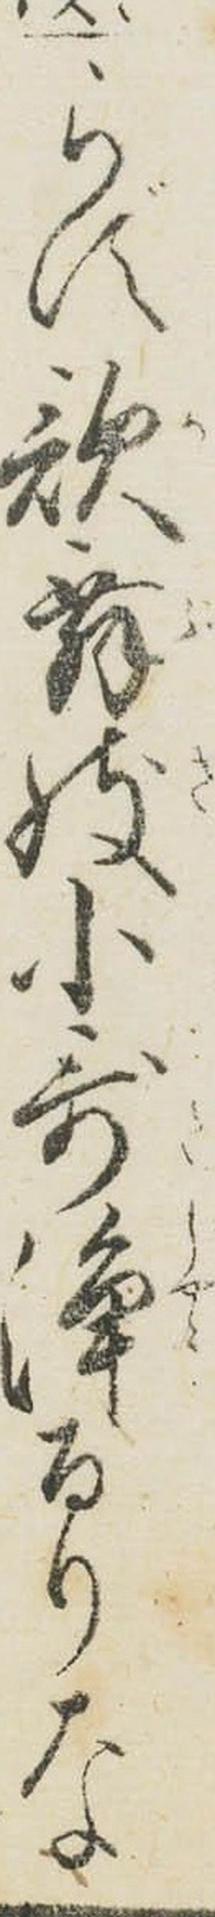らず歌舞妓小哥浄るりな
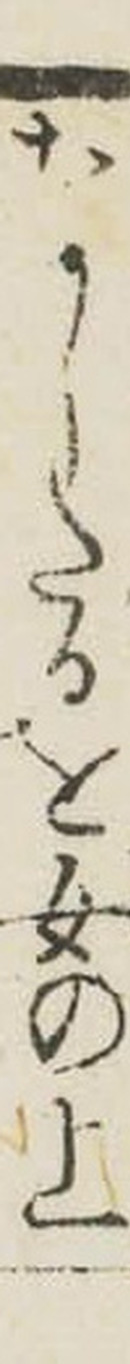なしたるを女の上
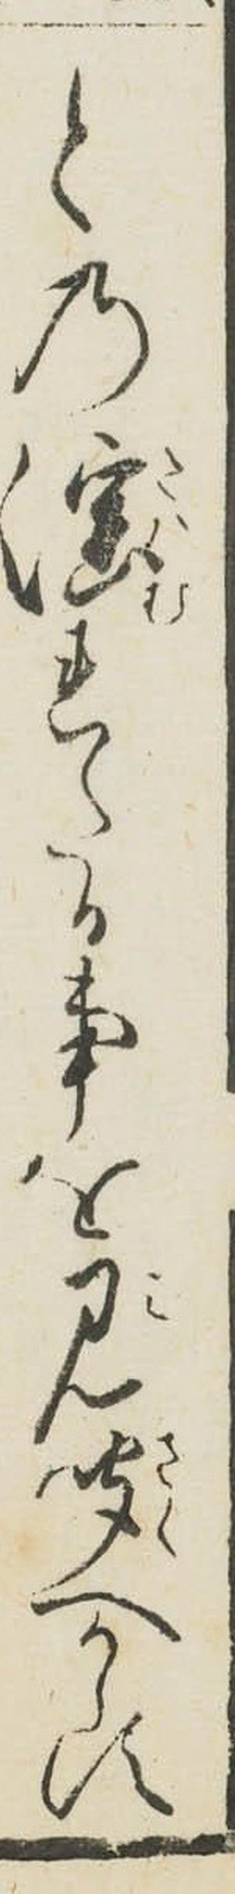との淫れたる事を見聞へからす
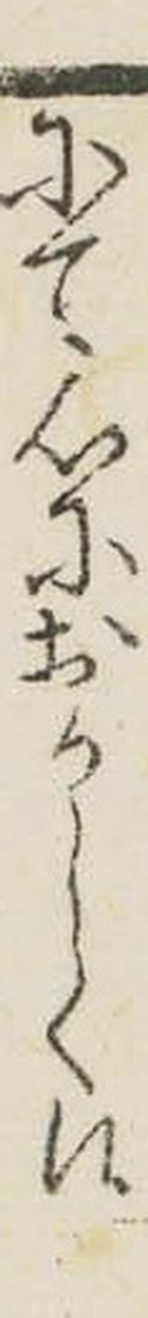にて心におかしく候
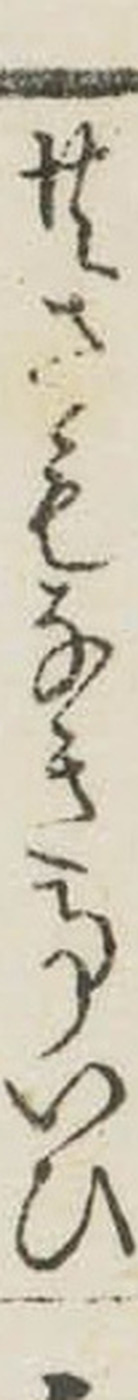共さもなき事いひ
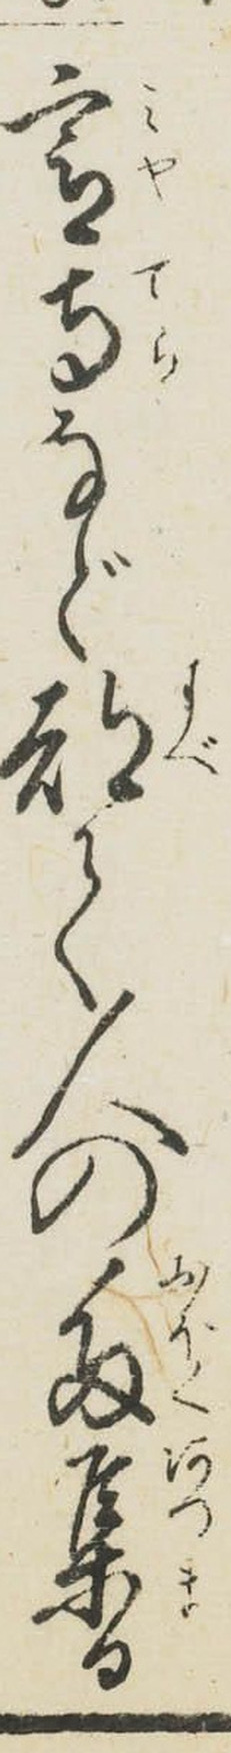宮寺など都て人の多集る
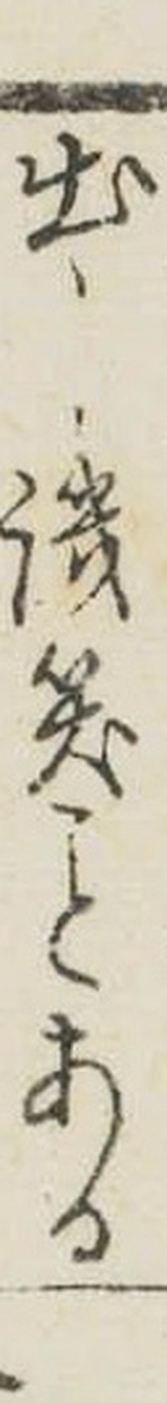出し譏笑ことある
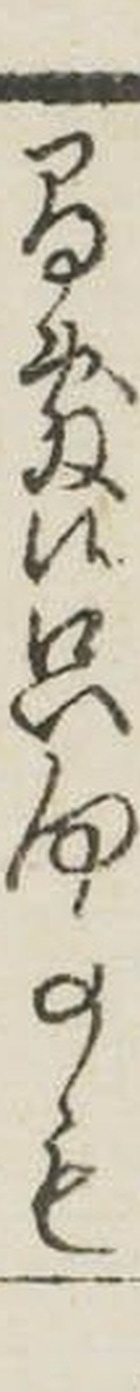間敷候只何事も
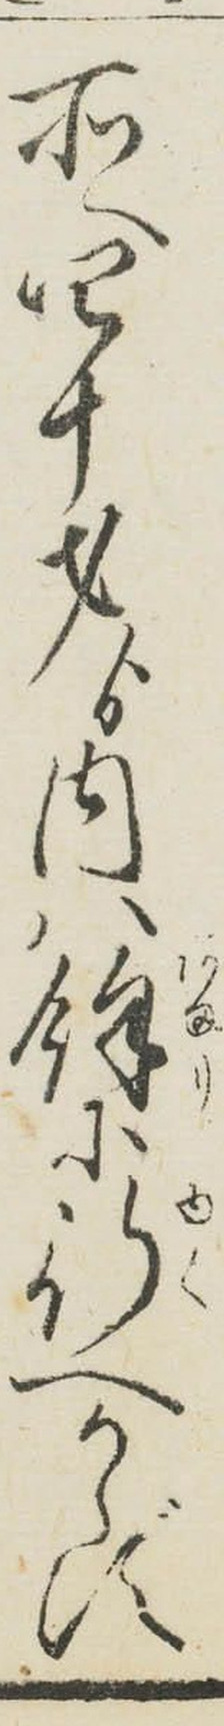所へ四十才より内は余に行へからず
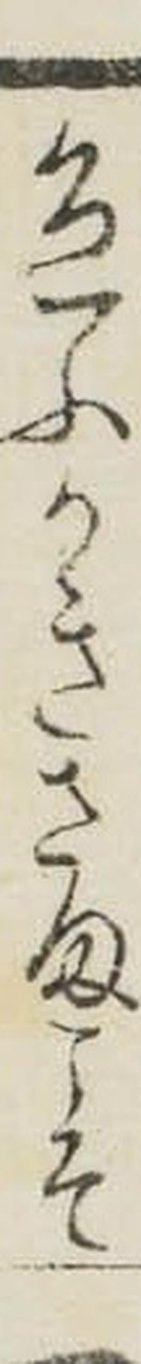色ふかきさまこそ
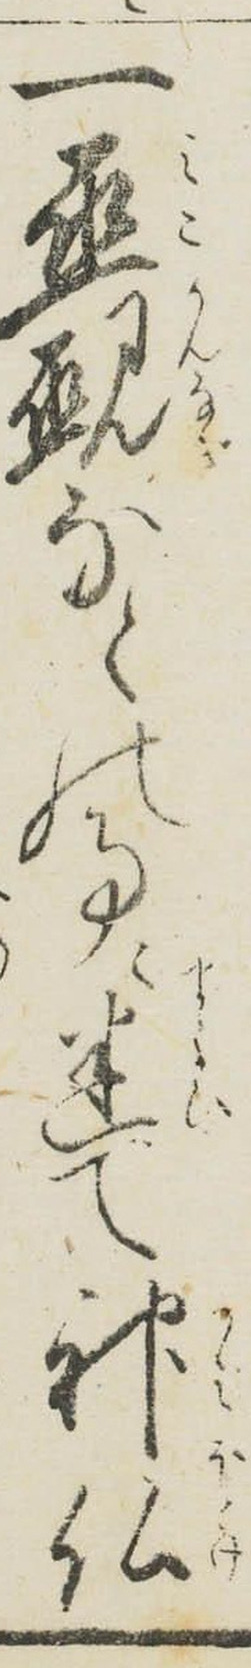一巫覡なとの事迷て神仏
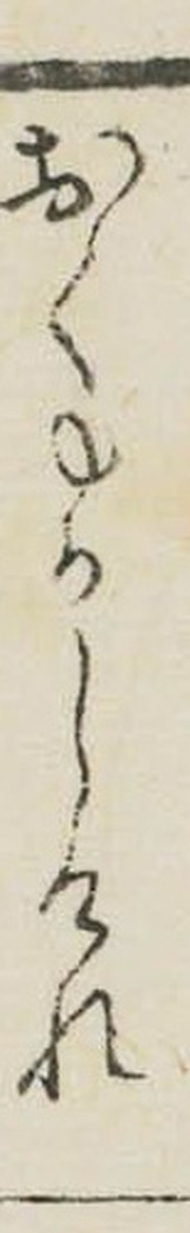おくゆかしけれ
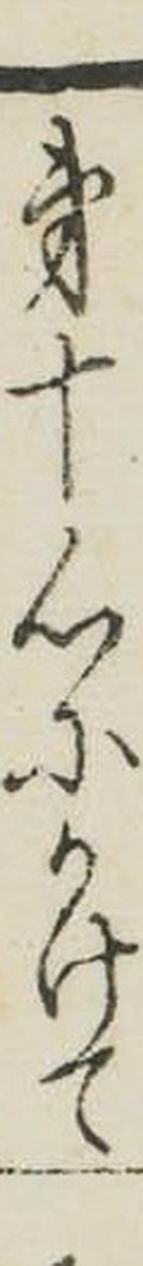第十心にかけて
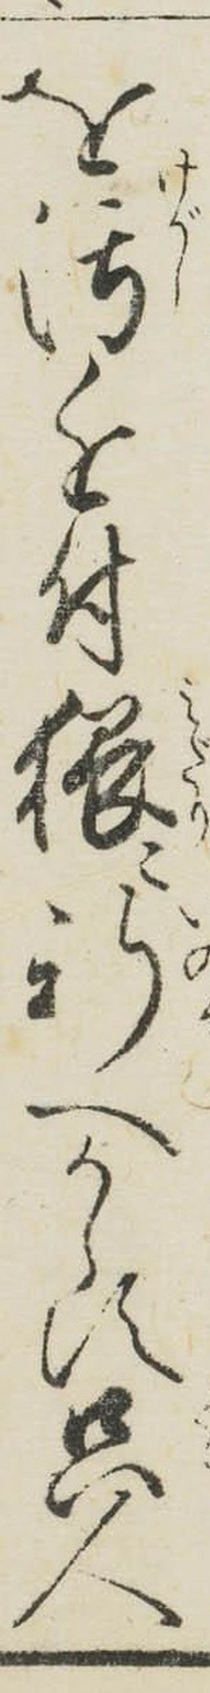を汚近付猥祈へからす只人
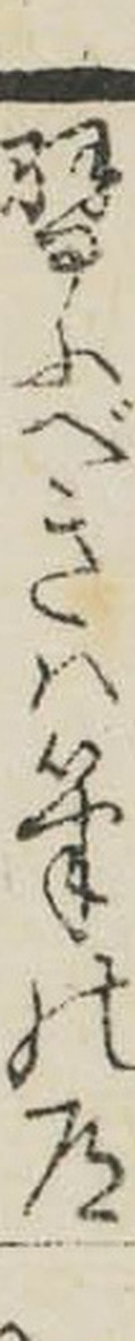習ふべきは筆の道
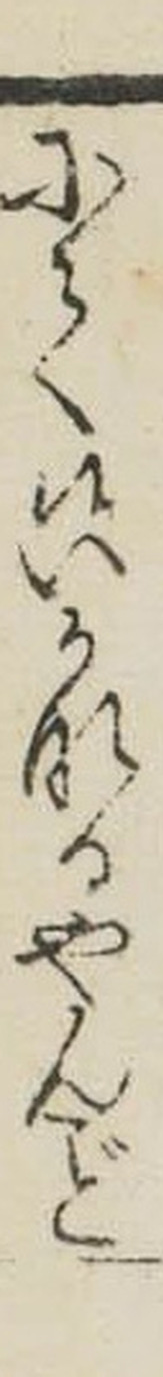にて候いかなるやんごと
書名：女大学
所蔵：東京学芸大学教育コンテンツアーカイブ
